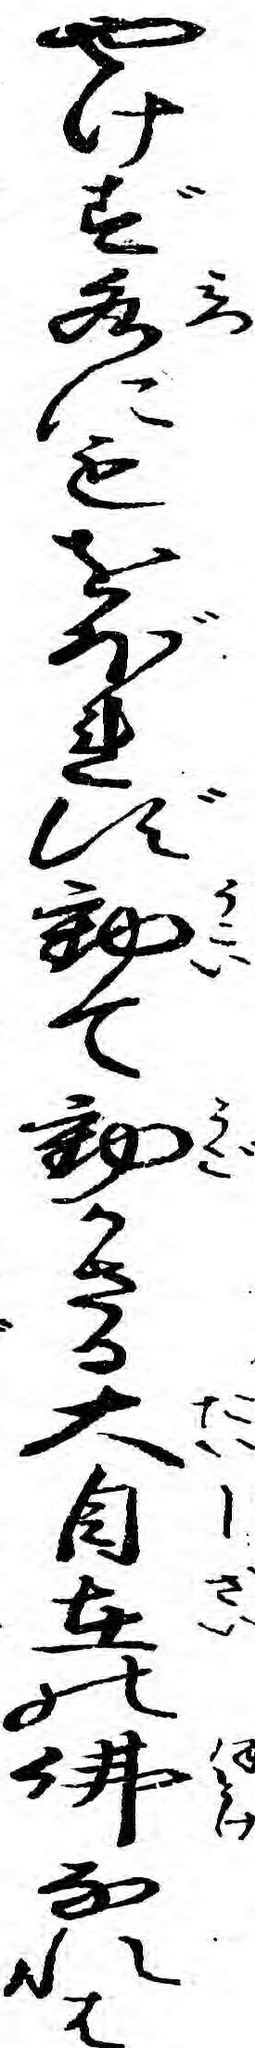やけず水にもをぼれず動て動かさる大自在の仏なれは
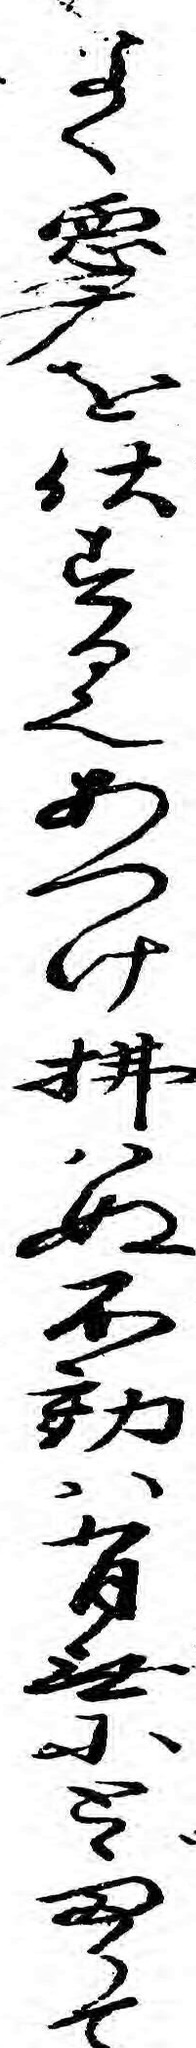よく悪魔を伏する也あつけ払はぬ不動は有無にとゞまりて
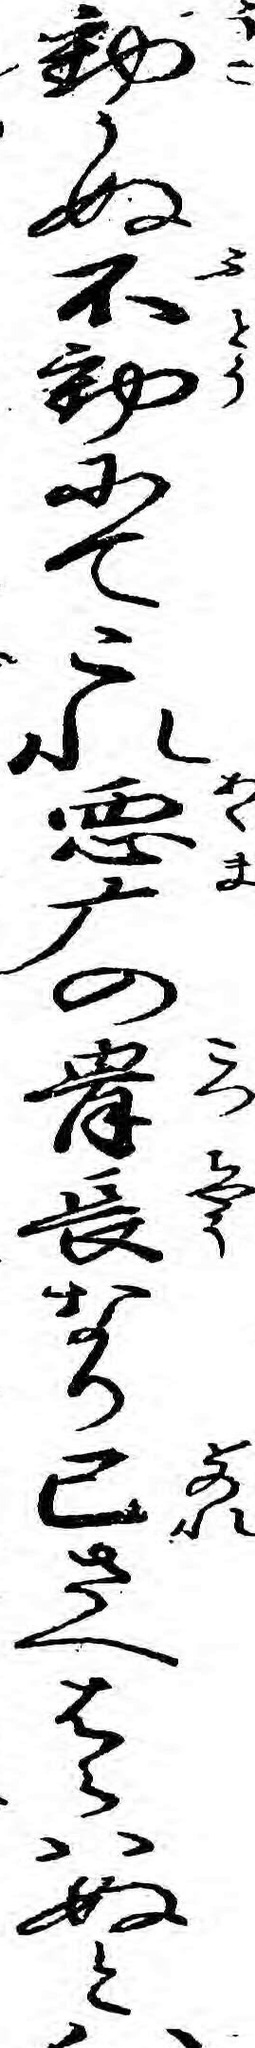動かぬ不動にてこれ悪魔の骨長なり己さへはらはぬとは
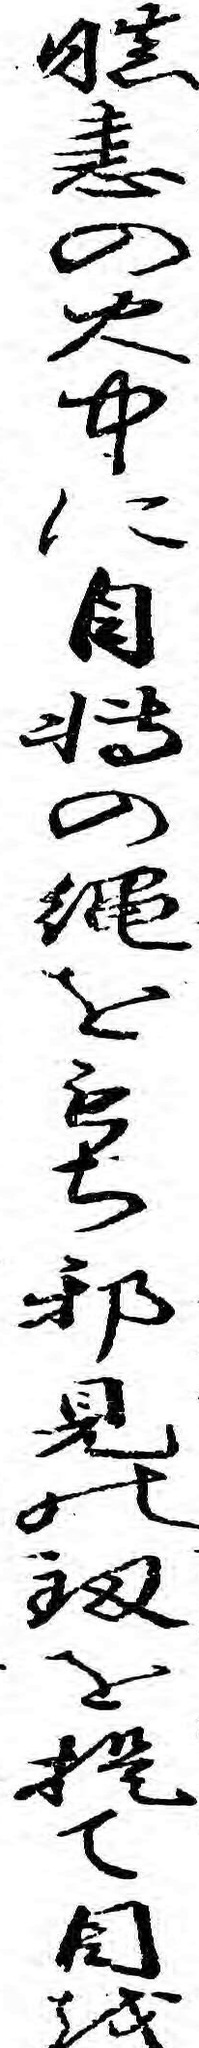瞋恚の火中に自縛の縄をもち邪見の剣を提て目を
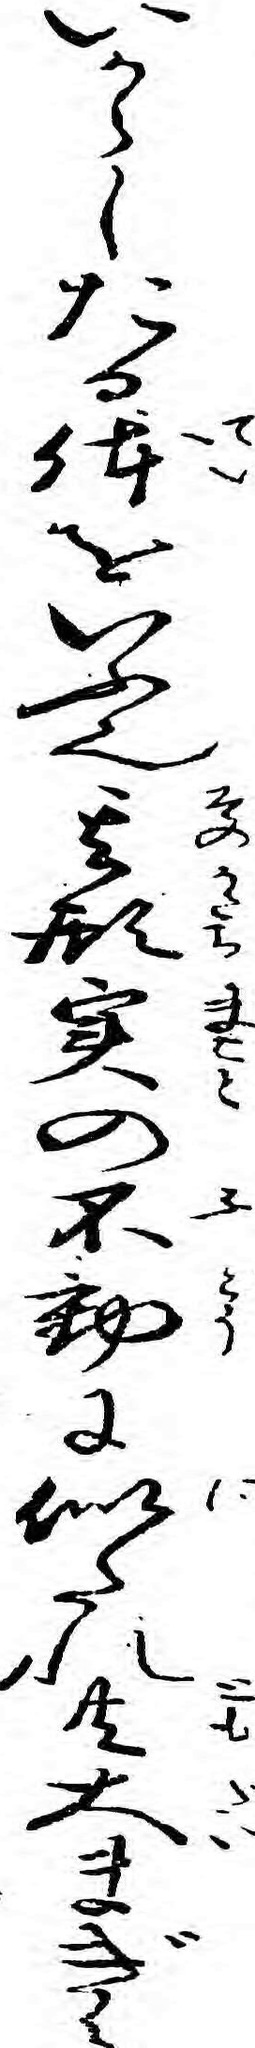いからしたる体をいふ也其形実の不動に似たれ共大まぎら
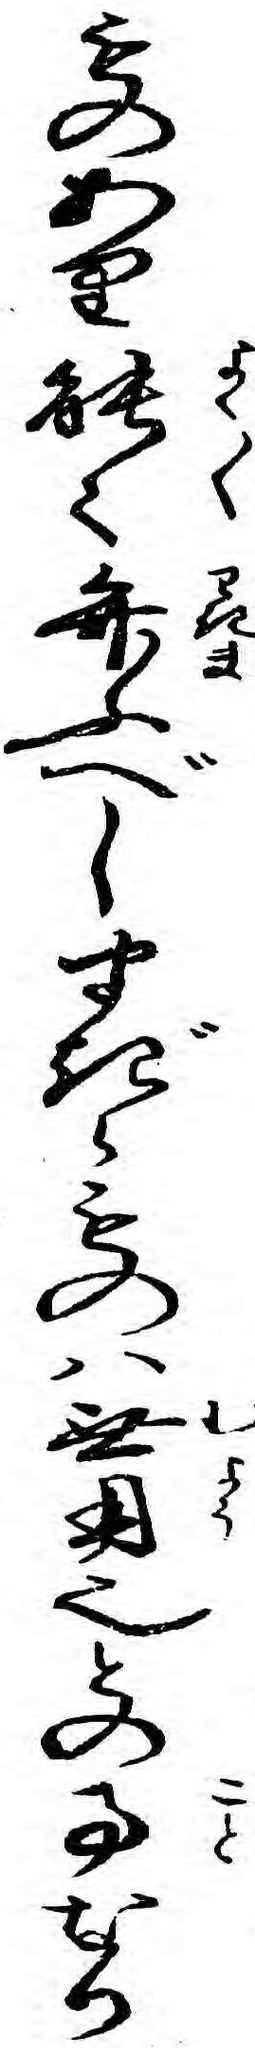ものあり能々弁ふべしまぎらものは無用也との事なり
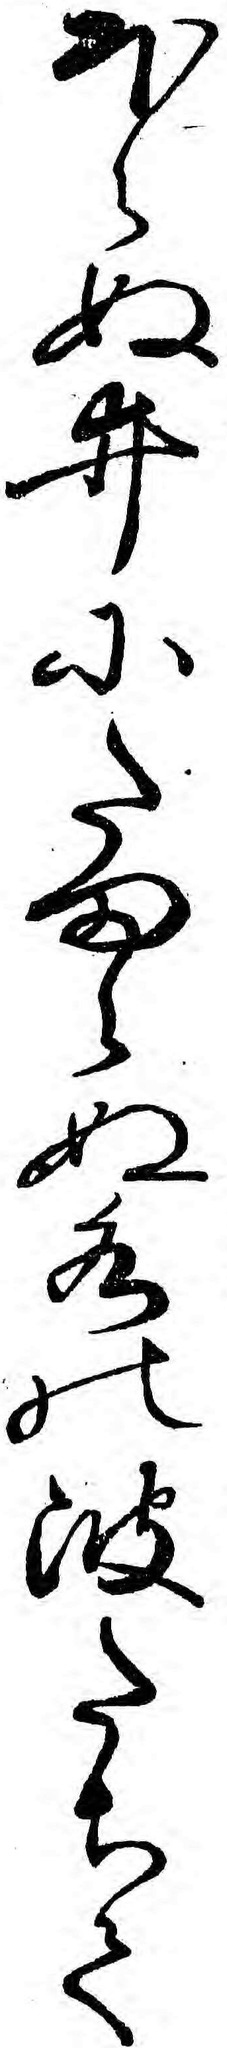ほらぬ井にたまらぬ水の波たちて
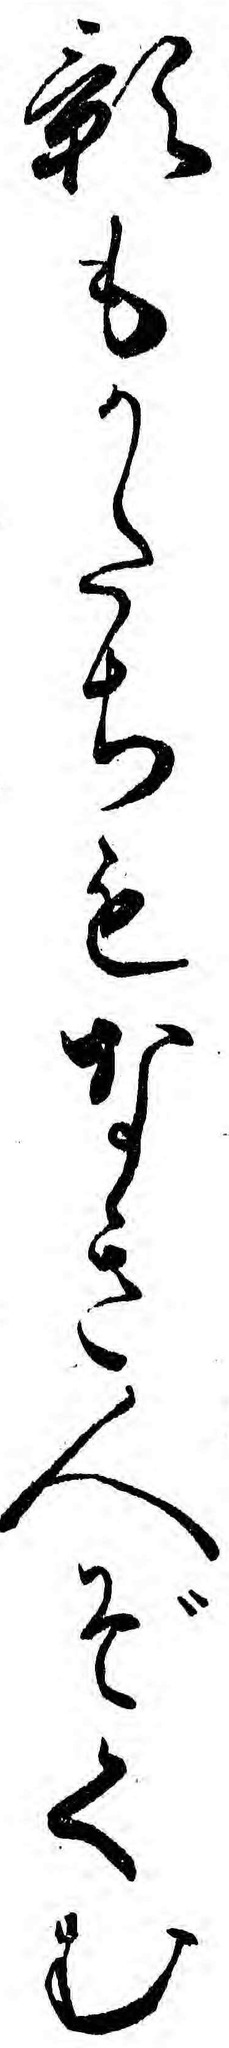影もかたちもなき人ぞくむ

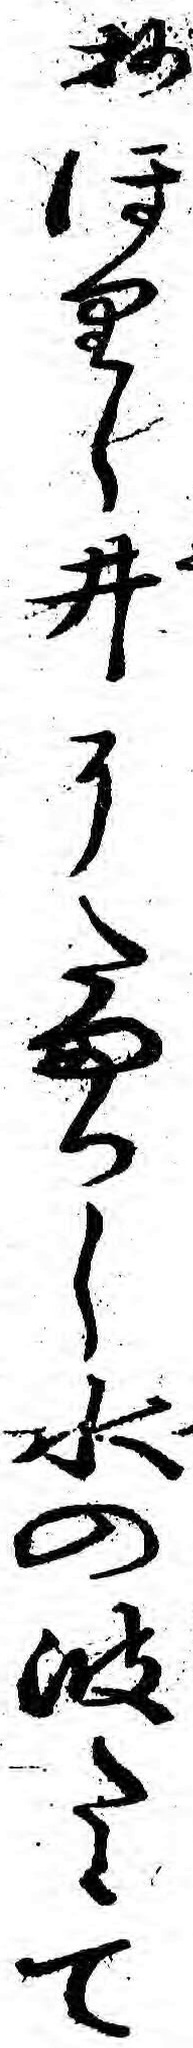ほりし井にたまりし水の波たゝて
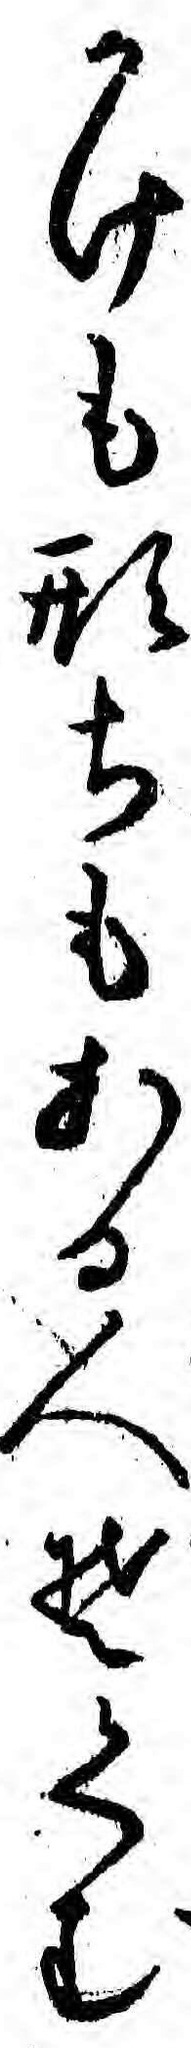かげも形ちもある人ぞくむ
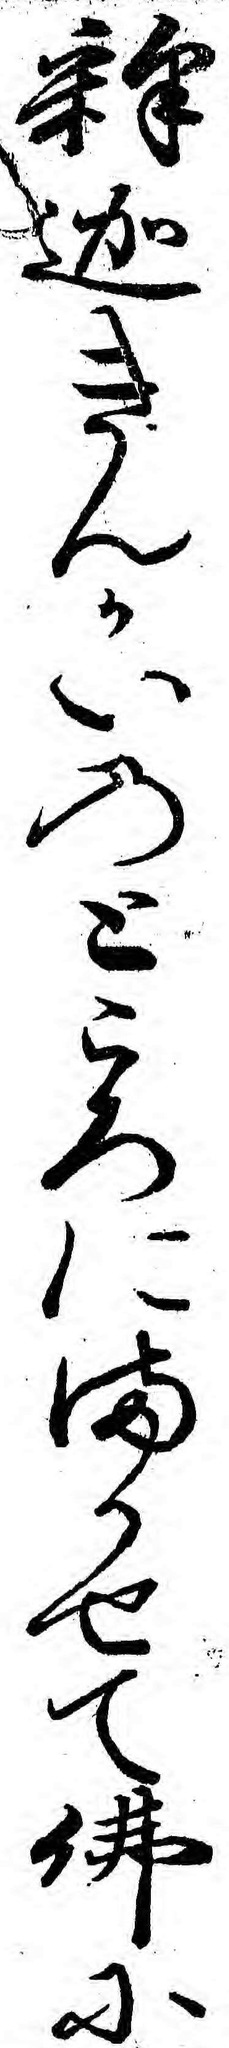釈迦きんかいのところにまかせて仏に
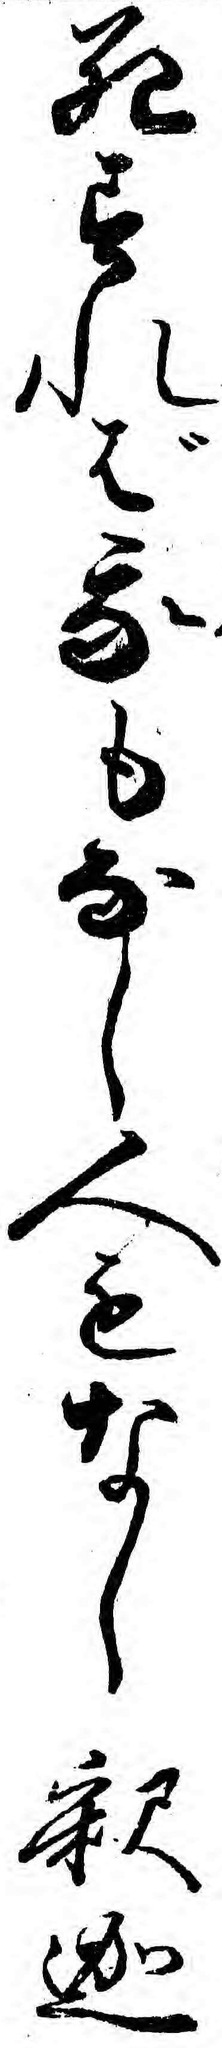死すれば我もなし人もなし釈迦
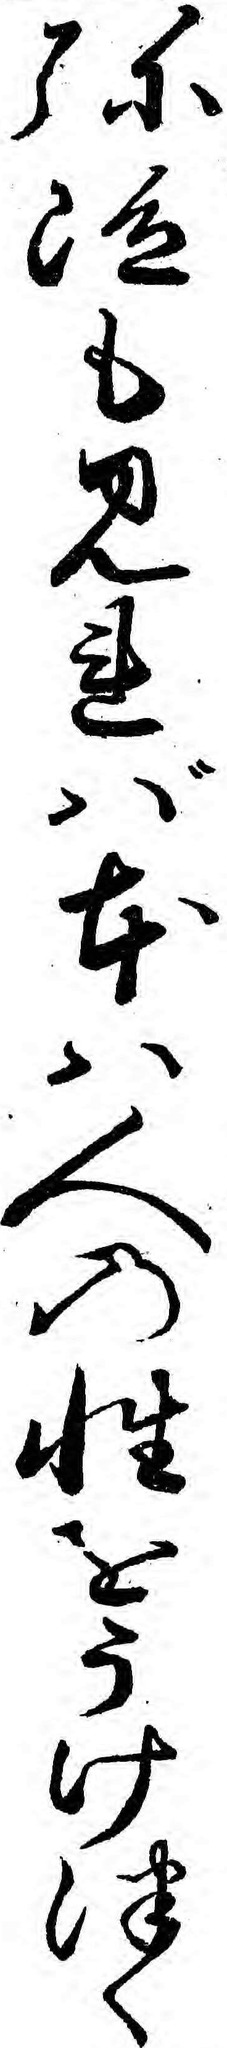弥陀も見れば本は人の性をうけつく
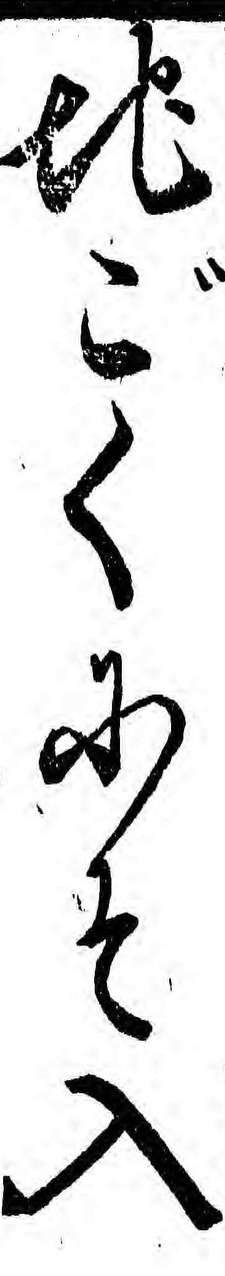地ごくにそ入
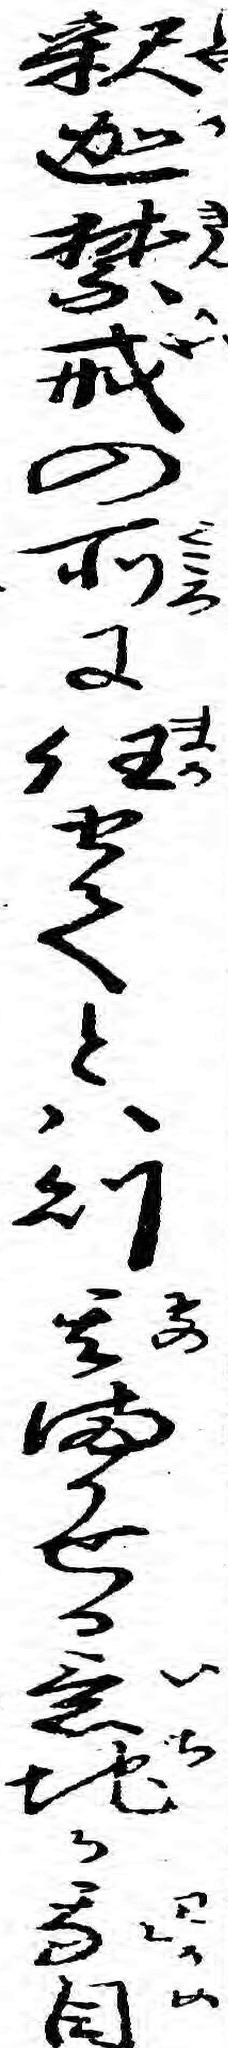釈迦禁戒の所に任せてとは則其まかせる意地か我自
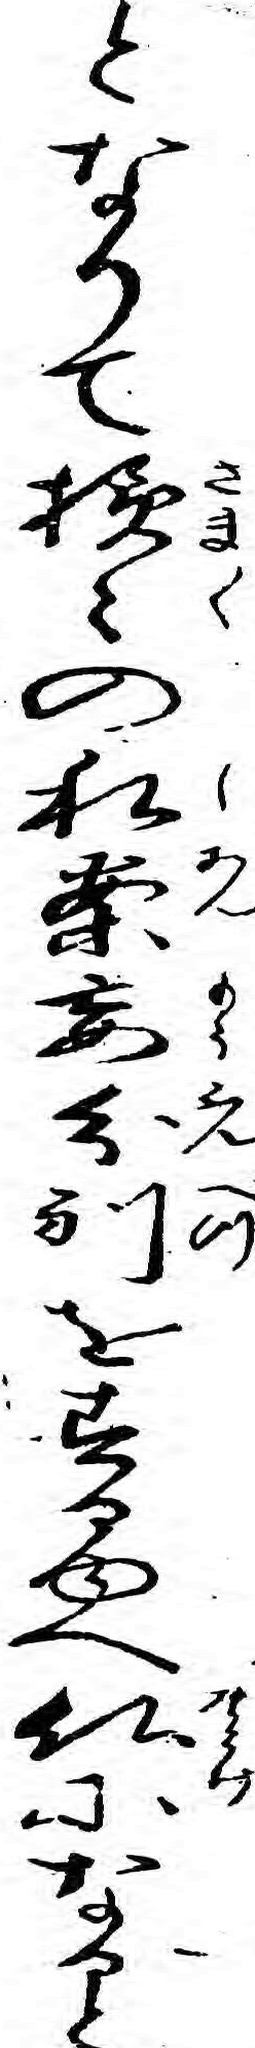となりて様々の私案妄分別をするゆへ仏になると
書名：目なし用心抄
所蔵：国文学研究資料館
